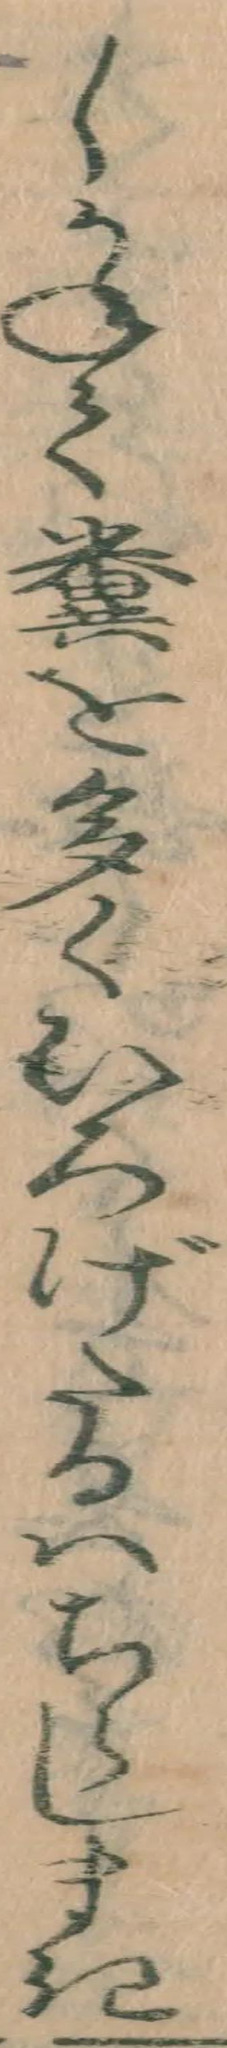しかねて糞を多くひろげたるはちらしまき
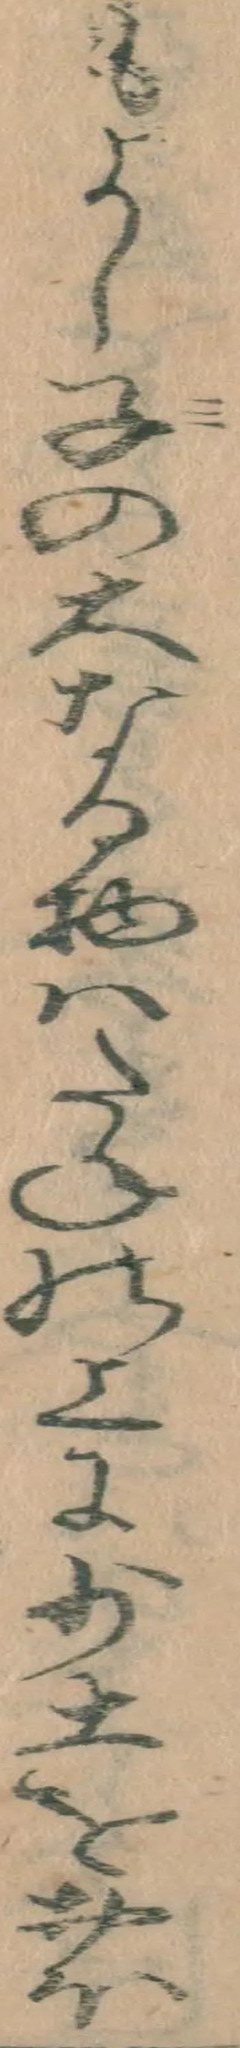もよし子の大なる物はたねの上に少土をおほ
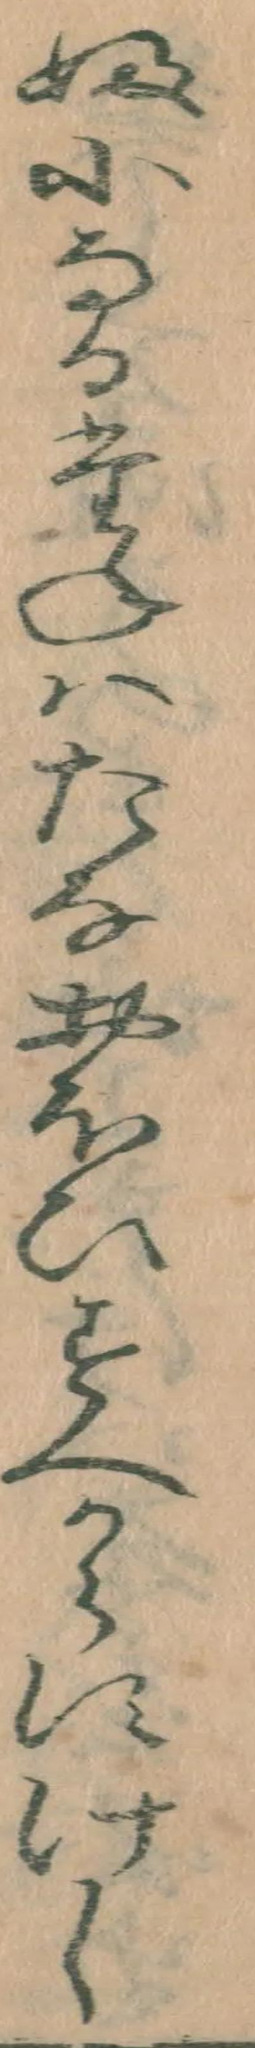ふ小なるたねはたなおほひすへからすけし
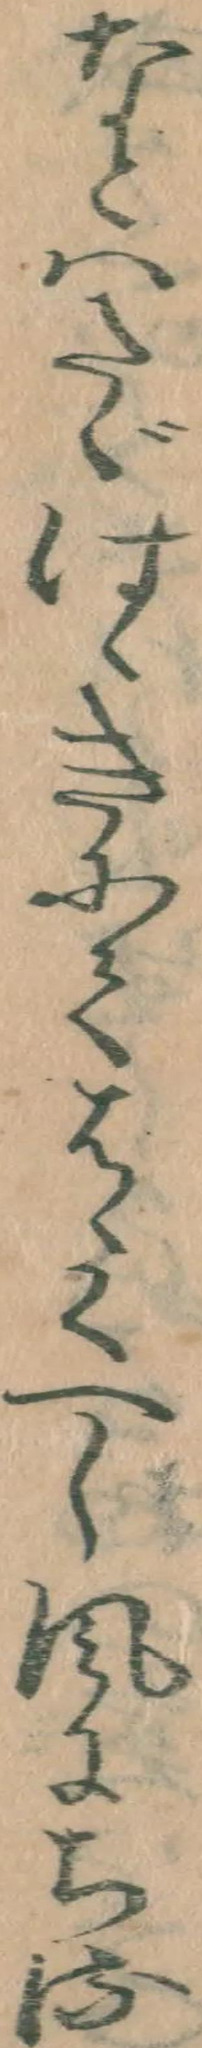なとはたゞはゝきにてはゝくへし風にちる
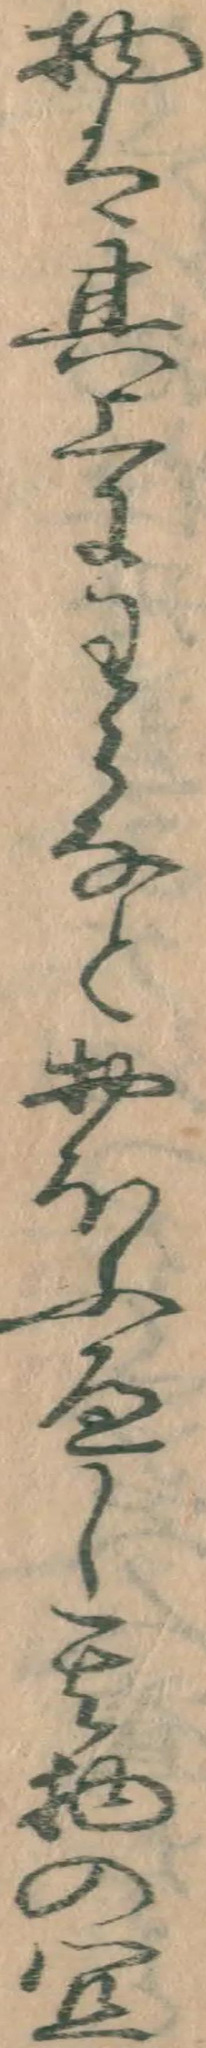物は其うえにわらなとおほふへし其物の宜
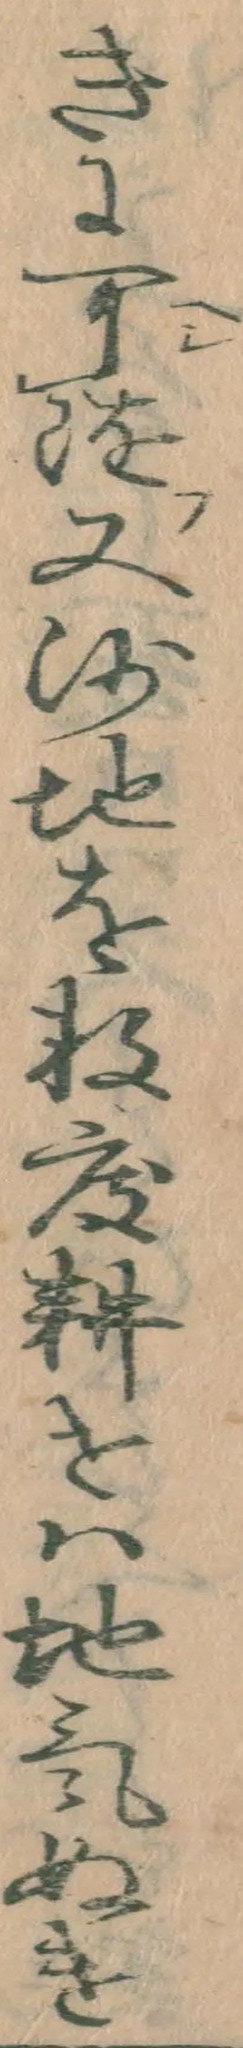きに可随又沙地を数度耕せは地気ぬけ
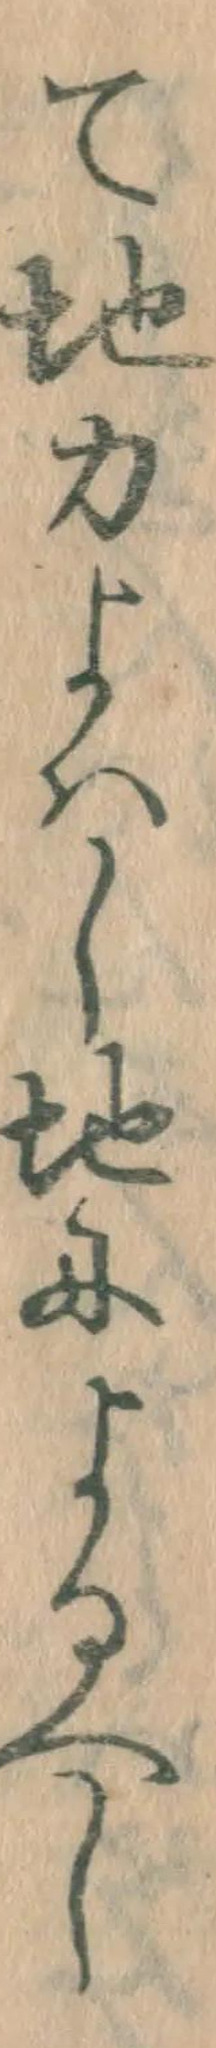て地力よはし地によるへし
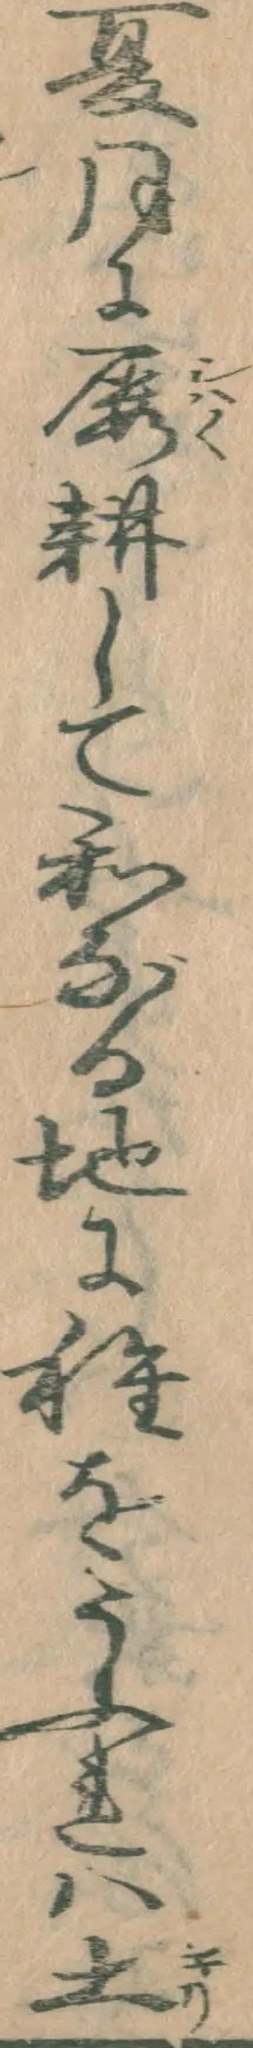夏月に屡耕して和なる地に種をうふれは土
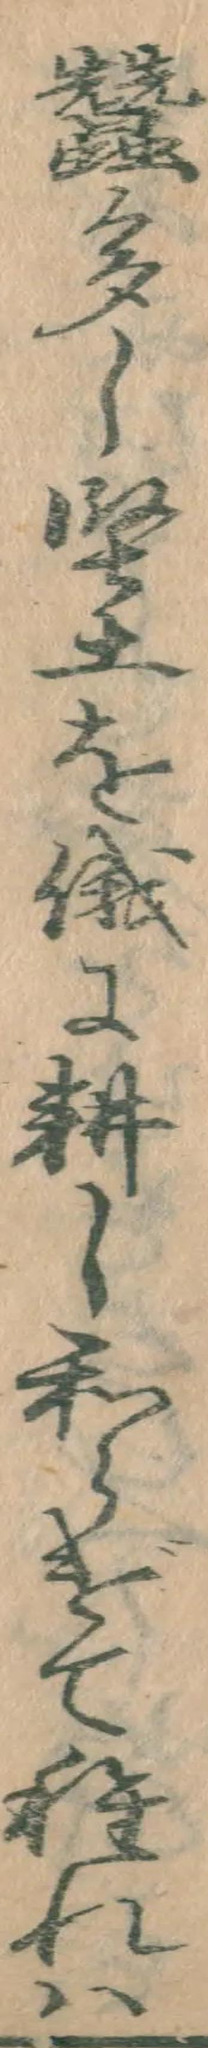蠶多し堅土をに俄に耕し和らけて種れは
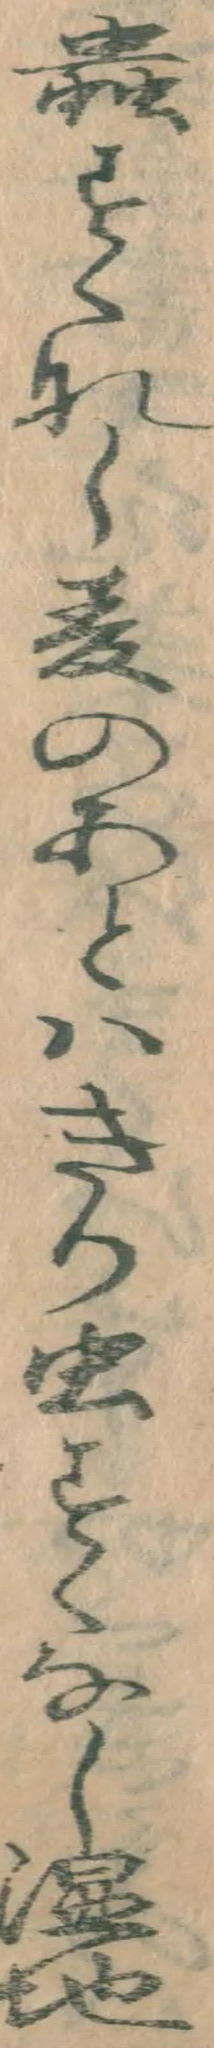蟲すくなし麦のあとはきり虫すくなし湿地
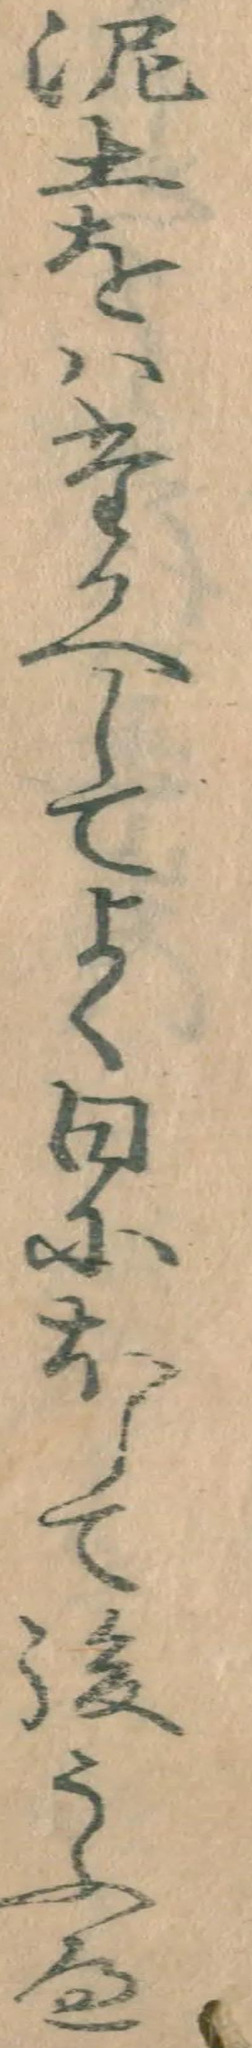泥土をはたかへしてよく日にほして後うふへ

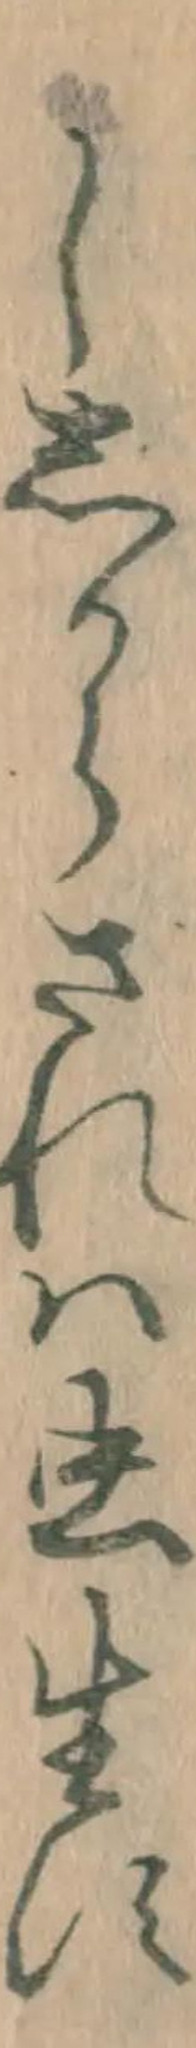ししからされは虫生す
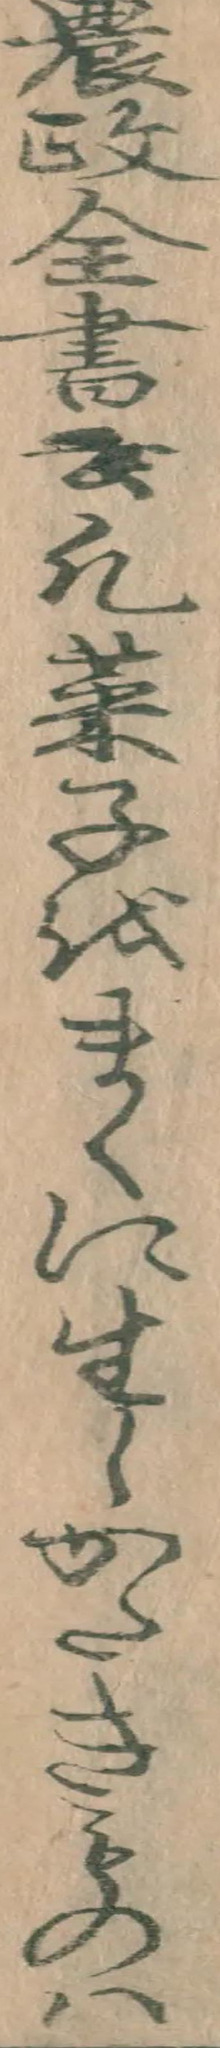農政全書云凡菜子をまくに生しかたきものは
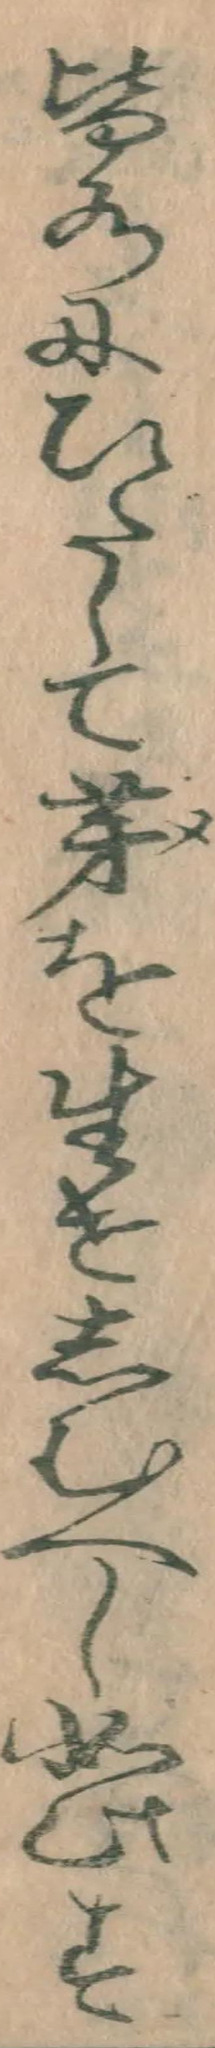皆水にひたして芽を生せしむへし如此す
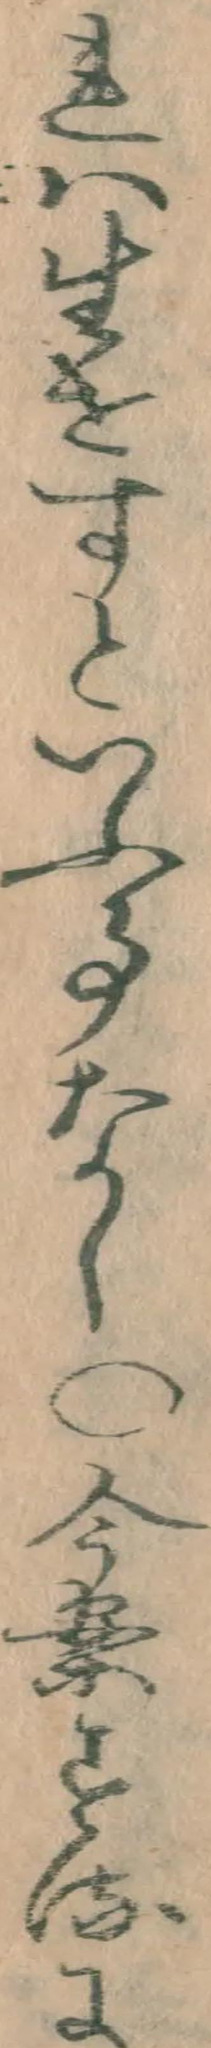れは生せすといふ事なし〇今案するに
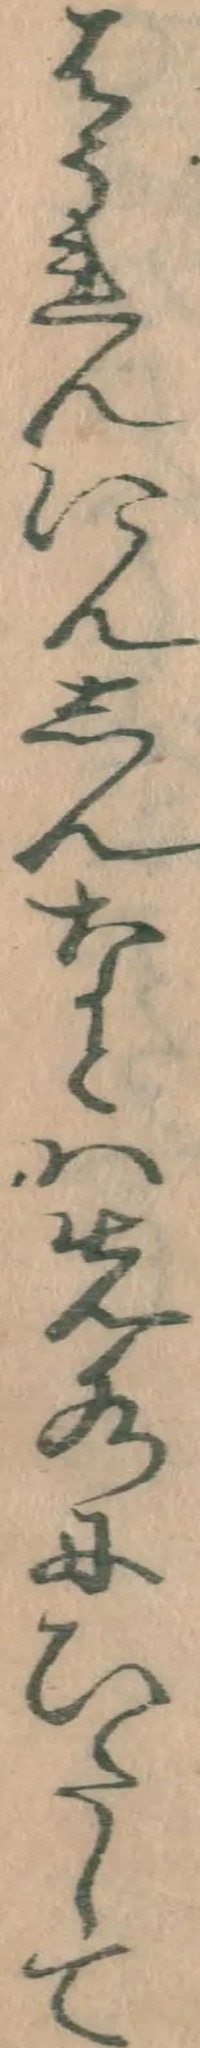はうれんにんしんなとは先水にひたして
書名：菜譜 3巻
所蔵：国立国会図書館 National Diet Library, JAPAN
